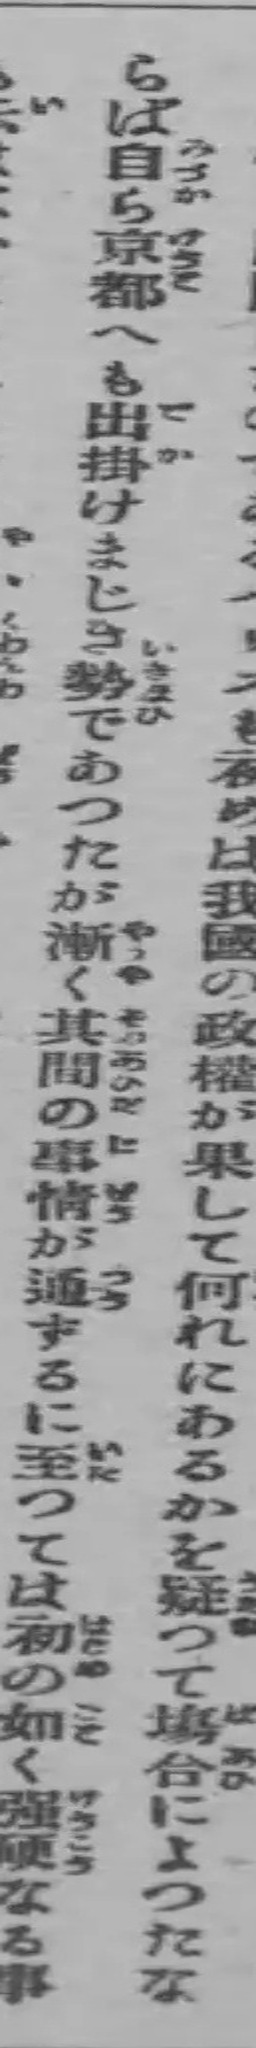らば自ら京都へも出掛けまじき勢であつたが漸く其間の事情が通ずるに至つては初の如く強硬なる事
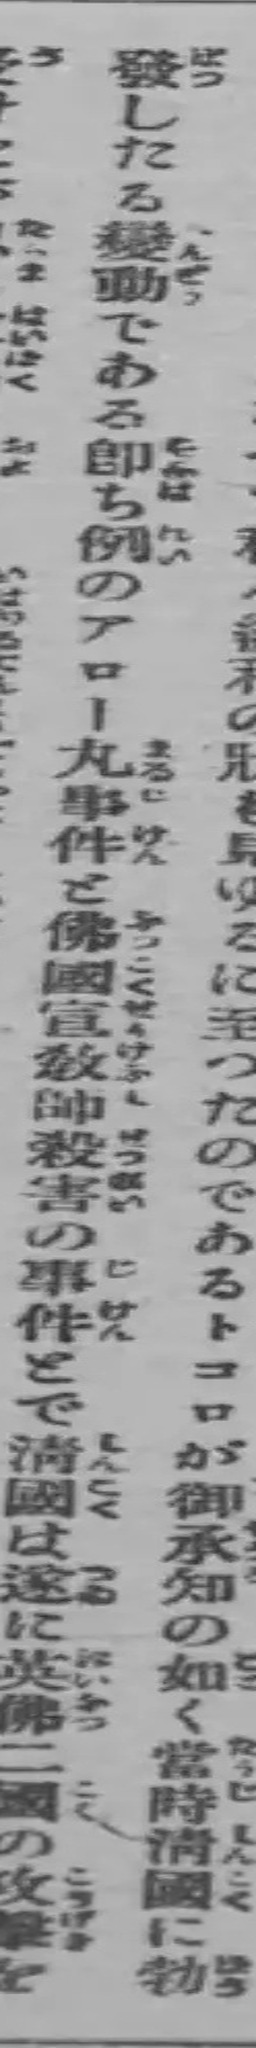発したる変動である即ち例のアロー丸事件と仏国宣教師殺害の事件とで清国は遂に英仏二国の攻撃を
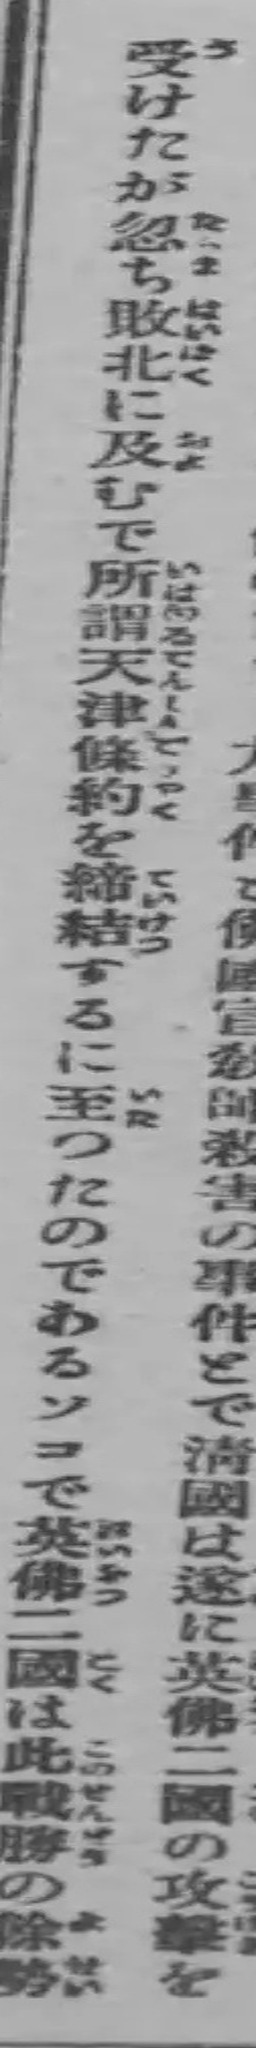受けたが忽ち敗北に及むで所謂天津条約を締結するに至つたのであるソコで英仏二国は此戦勝の余勢
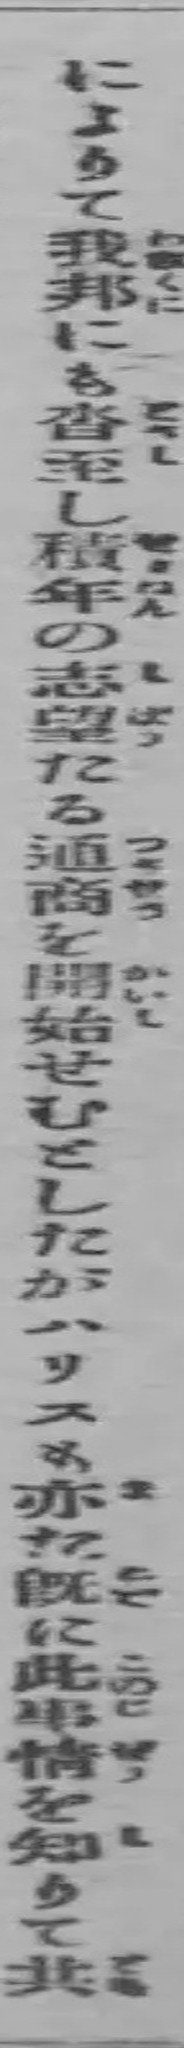によりて我邦にも沓至し積年の志望たる通商を開始せむとしたがハリスも亦た既に此事情を知りて共
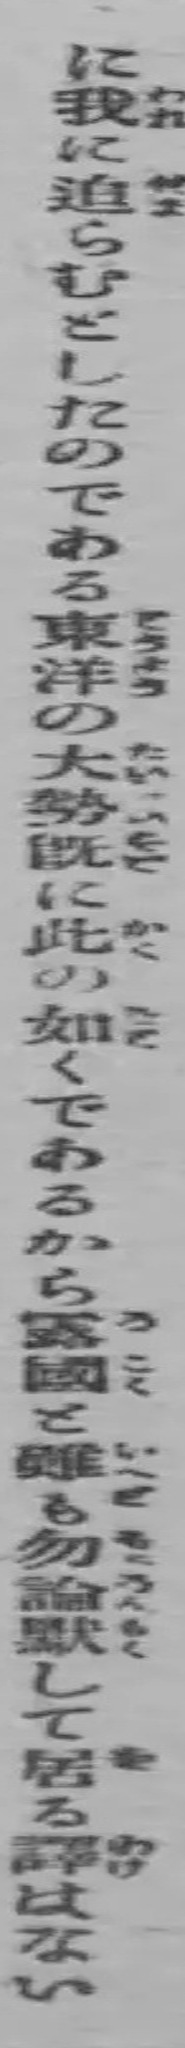に我に迫らむとしたのである東洋の大勢既に此の如くであるから露国と雖も勿論黙して居る訳はない
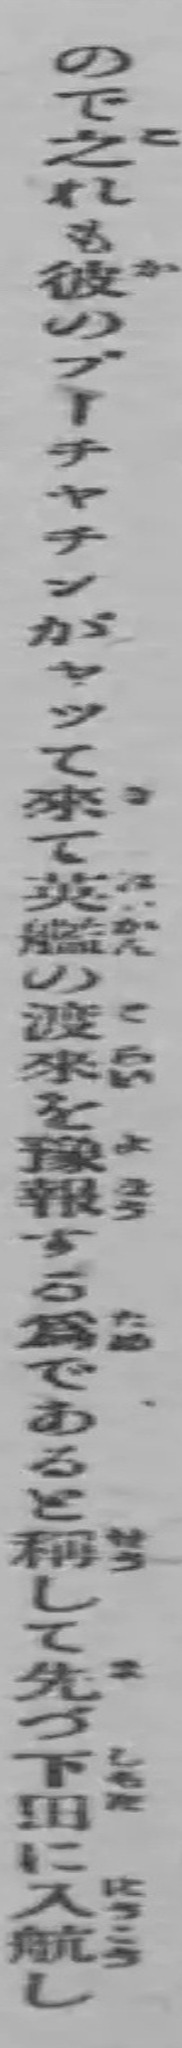ので之れも彼のプーチヤチンがヤツて来て英艦の渡来を予報する為であると称して先づ下田に入航し
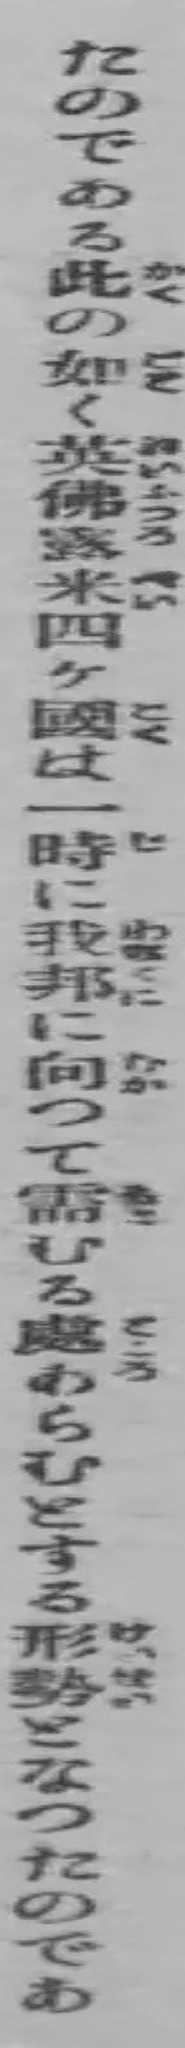たのである此の如く英仏露米四ケ国は一時に我邦に向つて需むる処あらむとする形勢となつたのであ
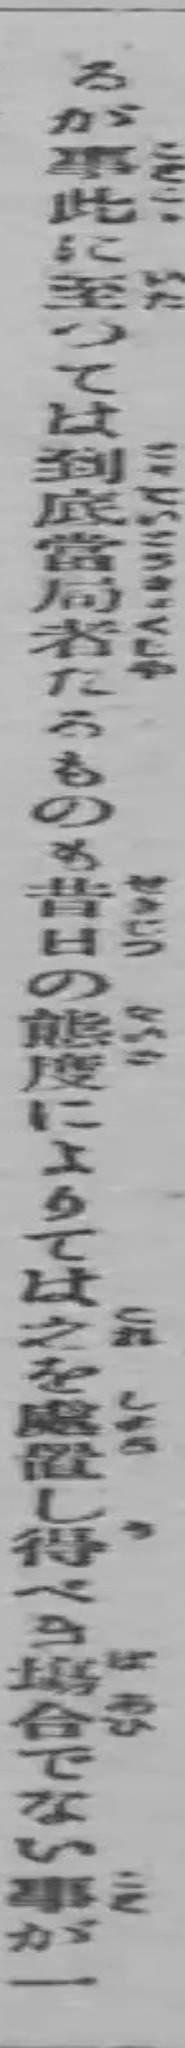るが事此に至つては到底当局者たるものも昔日の態度によりては之を処置し得べき場合でない事が一
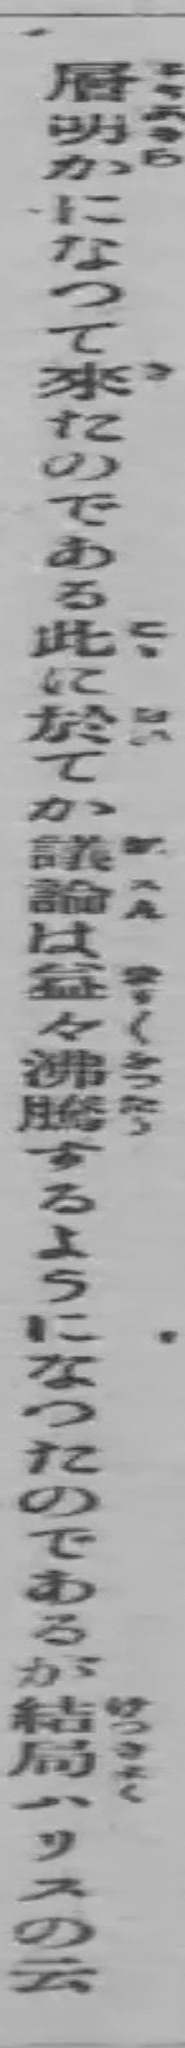層明かになつて来たのである此に於てか議論は益々沸騰するようになつたのであるが結局ハリスの云
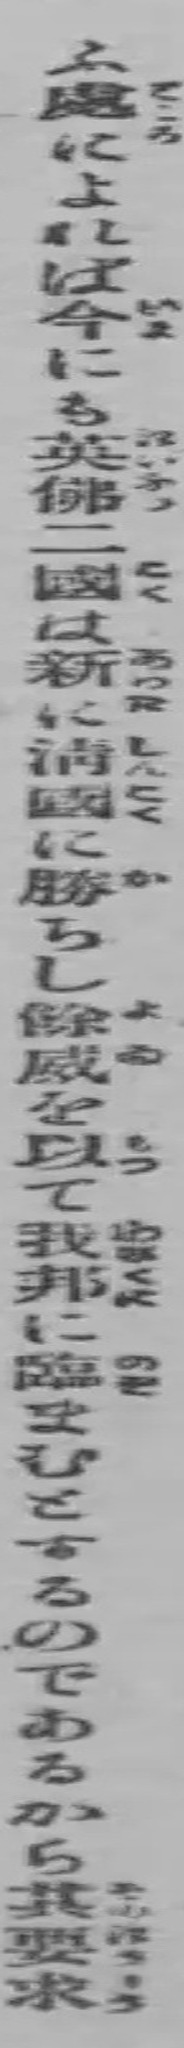ふ処によれば今にも英仏二国は新に清国に勝ちし余威を以て我邦に臨まむとするのであるから其要求
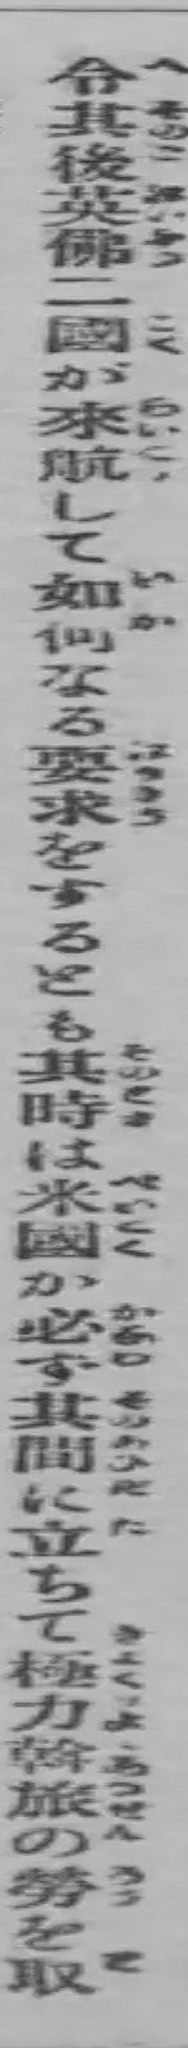令其後英仏二国が来航して如何なる要求をするとも其時は米国から必ず其間に立ちて極力斡旋の労を取
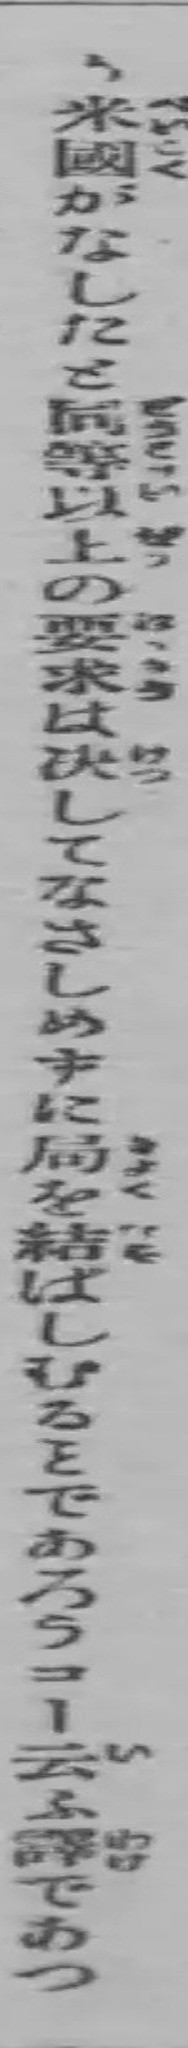り米国がなしたと同等以上の要求は決してなさしめずに局を結ばしむることであろうコー云ふ訳であつ
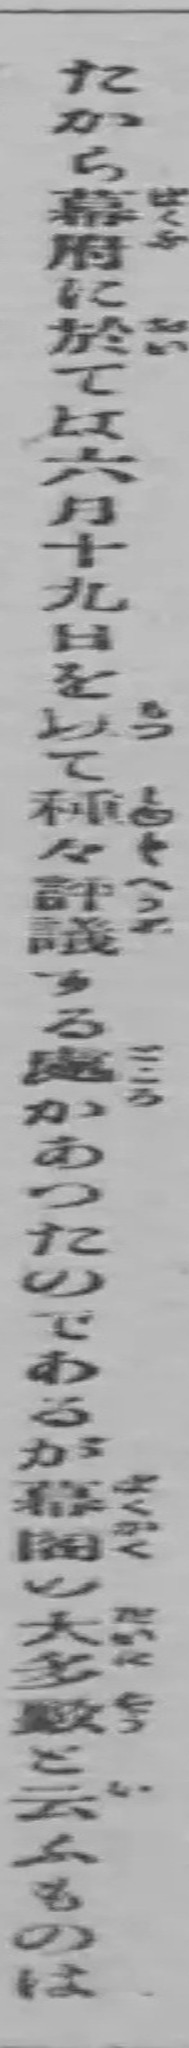たから幕府に於ては六月十九日を以て種々評議する処があつたのであるが幕閣の大多数と云ふものは
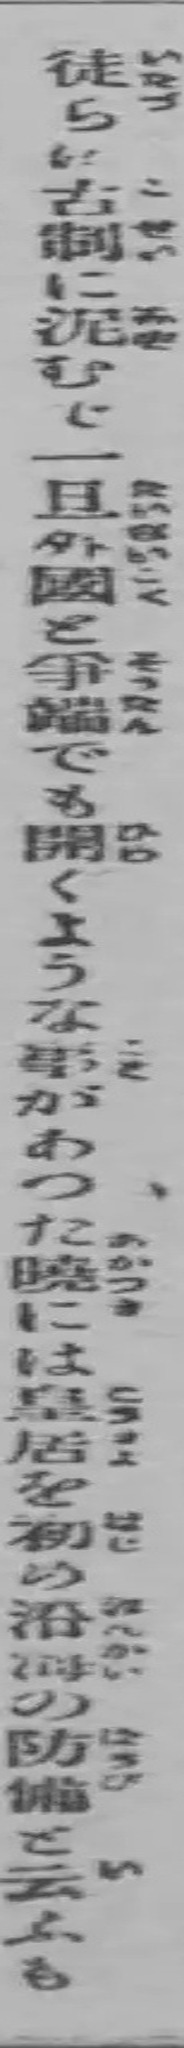徒らに古制に泥むで一旦外国と争端でも開くような事があつた暁には皇居を初め沿海の防備と云ふも
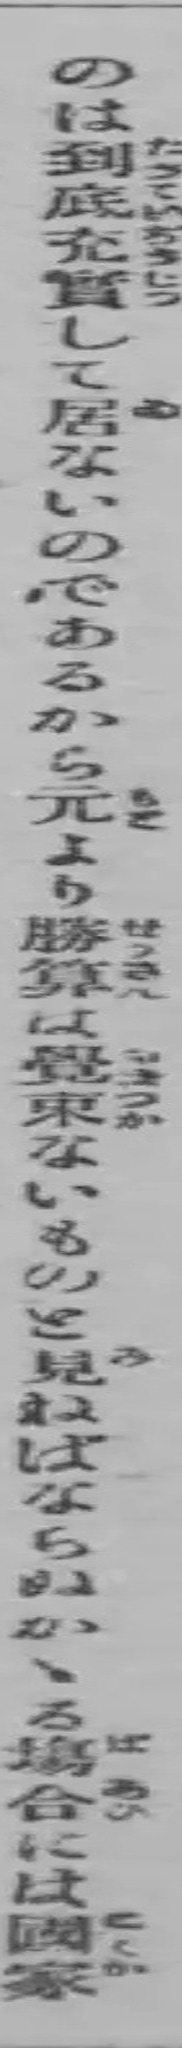のは到底充実して居ないのであるから元より勝算は覚束ないものと見ねばならぬかゝる場合には国家
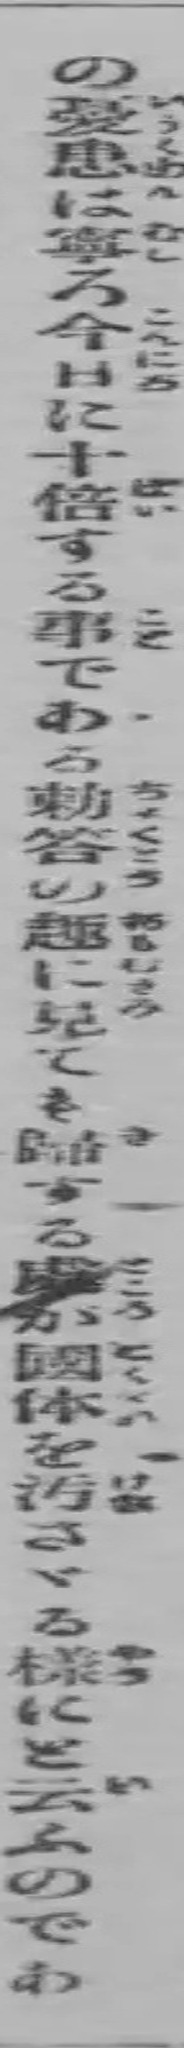の憂患は寧ろ今日に十倍する事である勅答の趣に見ても帰する処が国体を汚さゞる様にと云ふのであ
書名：豊橋市史談
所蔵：国立国会図書館 National Diet Library, JAPAN
